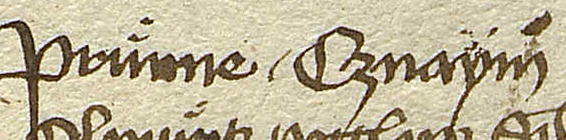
Prünne / Cʒnaym
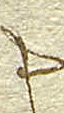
§
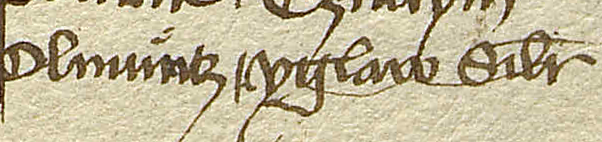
Olmüntʒ / Yglaw Silr*
